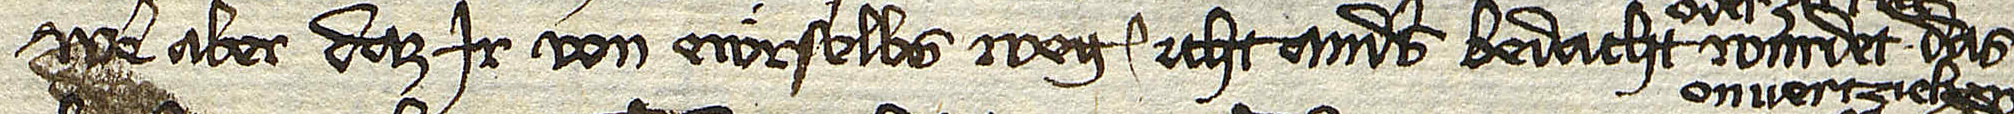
we* aber daʒ Ir von ewrſelbs weg* icht and*s bedacht wurdet . das
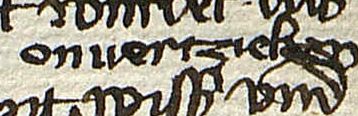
onuercʒiehen
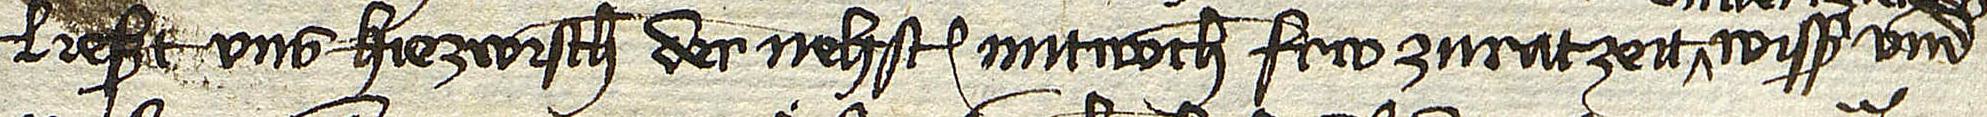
Lieſʒt vns hieʒwiſch* der nehſt* mitwoch* frw ʒuratʒeit wiſſ* vnd
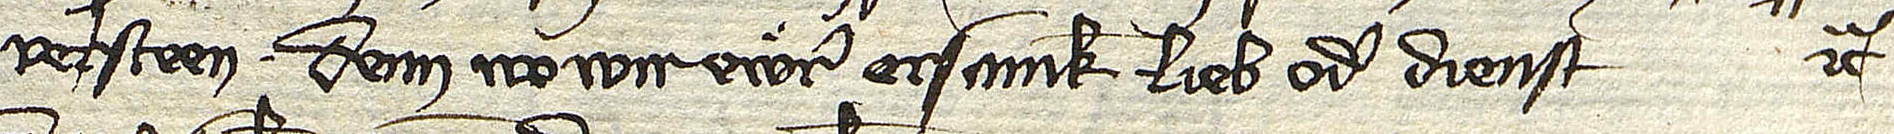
verſteen. Denn wo wir ewr* erſamk* Lieb od* dienſt ec*
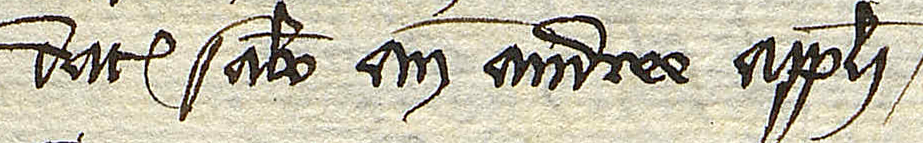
dat* ſabo* an* andree appli*
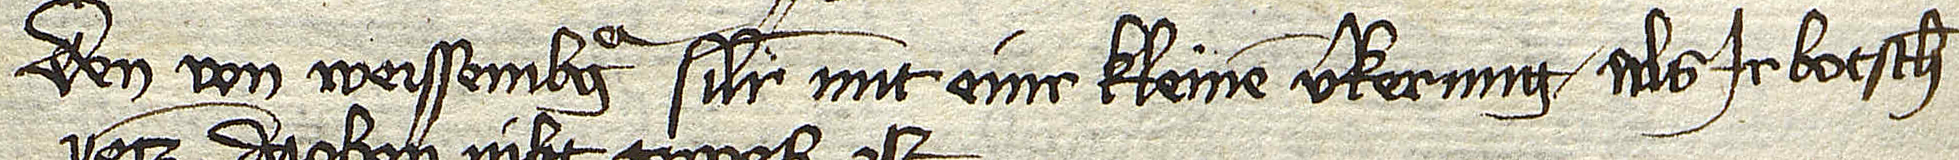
Den von weiſſembg* ſilr* mit einr kleine* v*kerung / als Ir botſch*
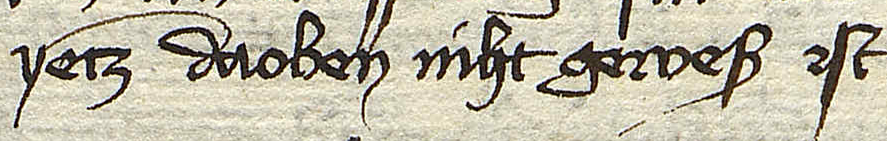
yecʒ daoben niht geweſ* iſt
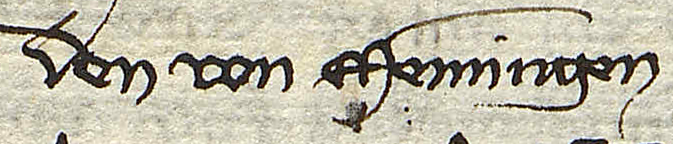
Den von Memingen*
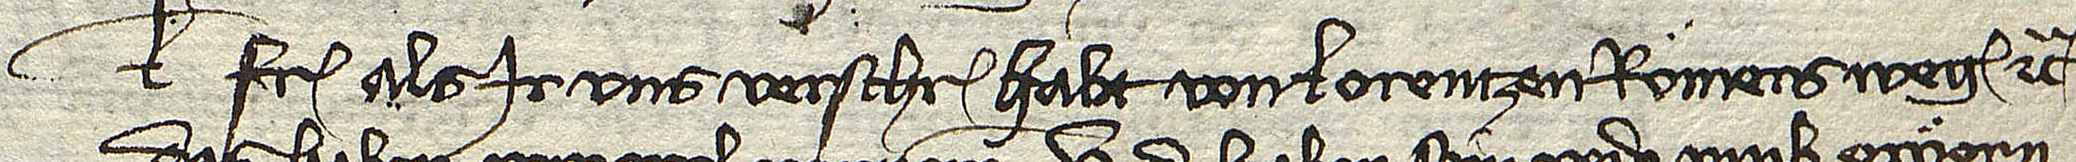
L* Fr* als Ir vns verſchr* habt von Lorencʒen Römers weg* ec*
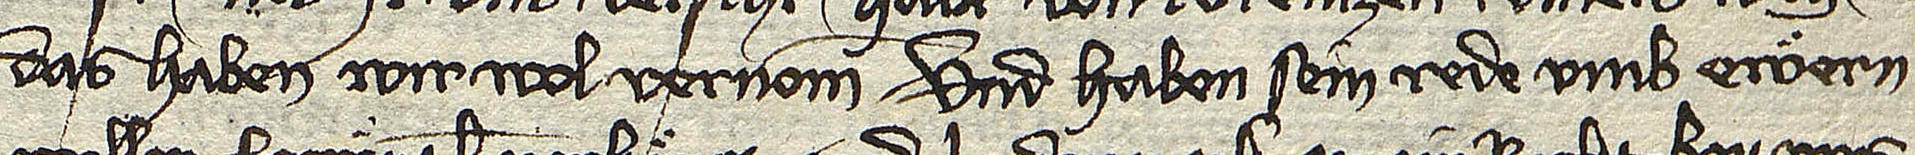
das haben wir wol vernom* Vnd haben ſein rede vmb ewern
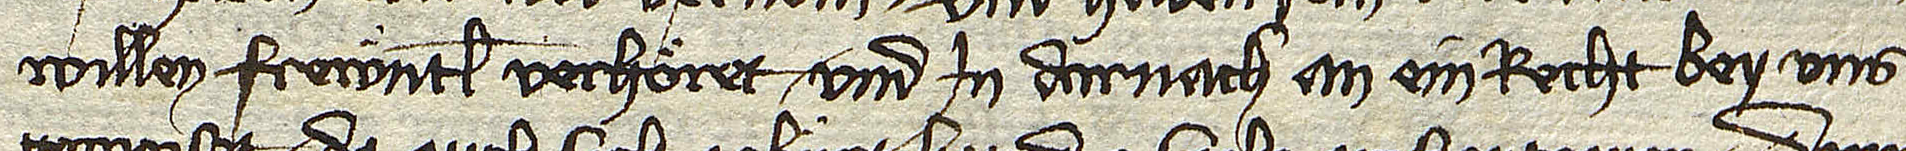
willen frewntl* verhöret / vnd In darnach an ein Recht bey vns
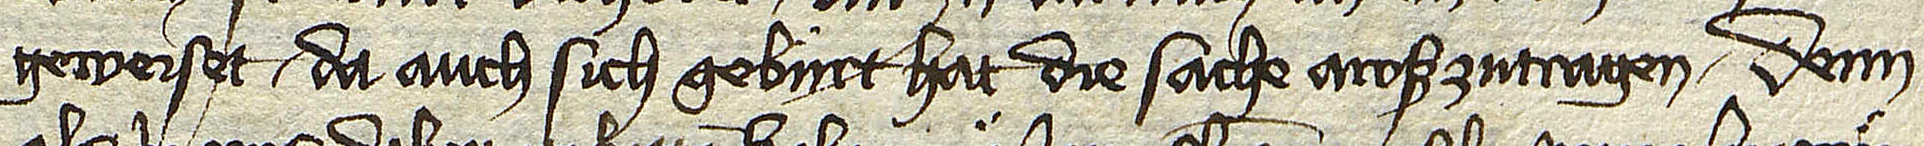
geweiſet / da auch ſich gebürt hat die ſache awſʒ ʒutragen / Denn
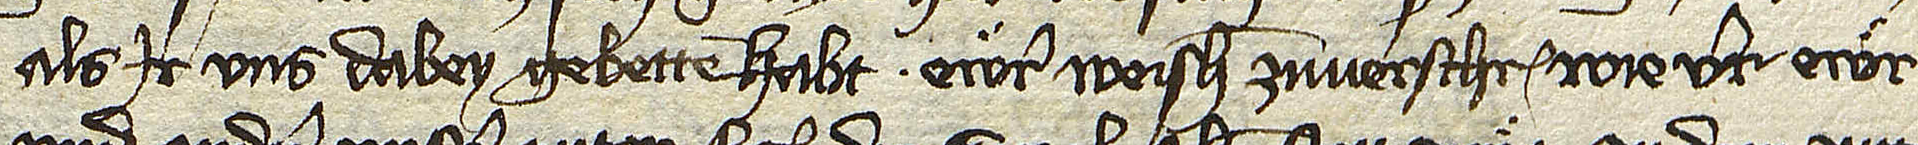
als Ir vns dabey gebette* habt . ewr* weiſh* ʒuuerſchr* wie v*r ewr
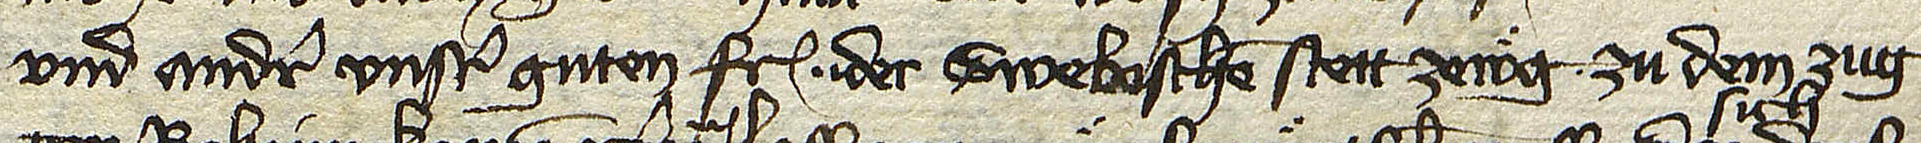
vnd andr* vnſr* guten fr* ~ der Swebiſche* ſtett ʒewg . ʒu dem ʒug
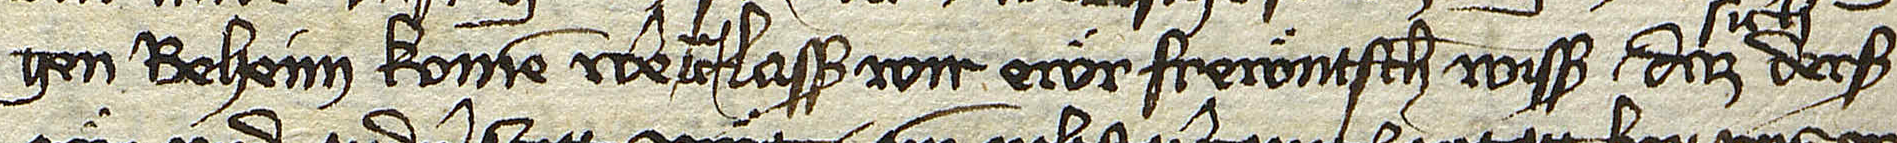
gen Beheim kom*e w*e ec* laſſ wir ewr frewntſch* wiſſ* / daʒ derſ*
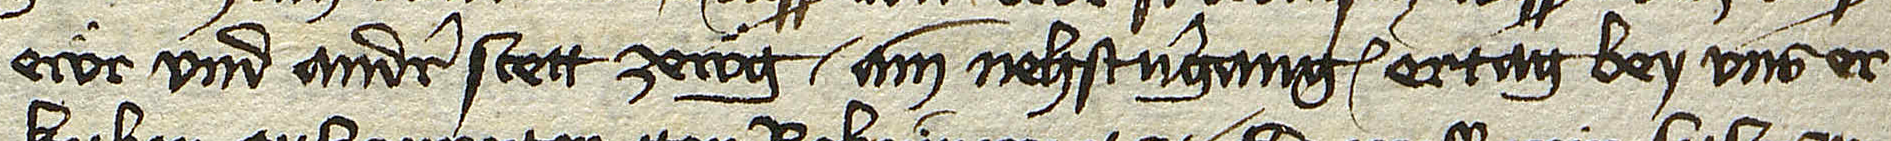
ewr vnd andr* ſtett ʒewg / am* nehſtu*gang* ertag bey vns er
